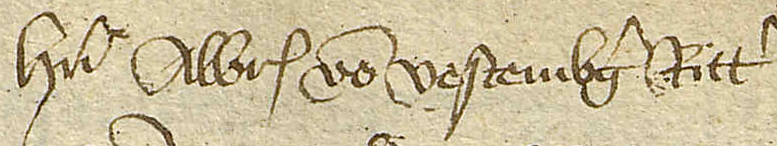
hn* Albr* vo* veſtembg* Ritt*
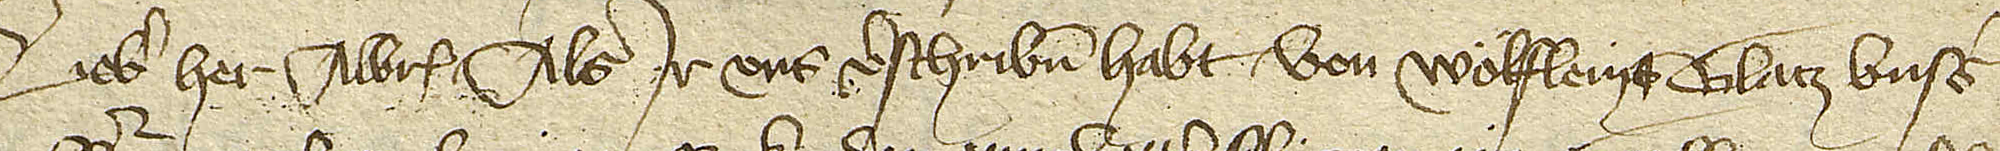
Lieb* her Albr* / Als Ir vns v*ſchribn* habt / von wölfleins Glacʒ vnſs*
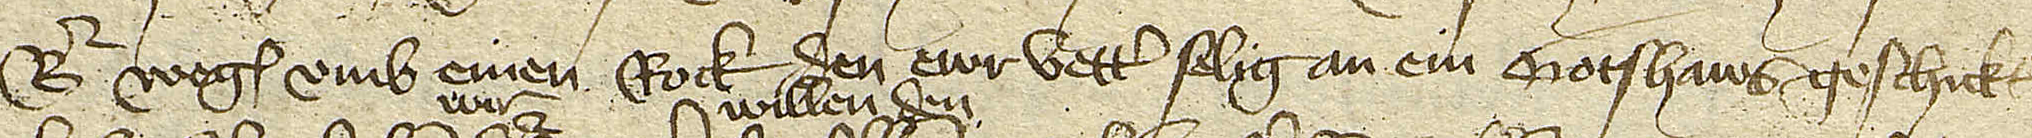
B* weg* vmb einen Rock den ewr vett* ſelig an ein Gotshaws geſchickt
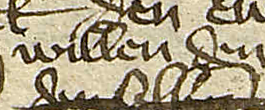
willen den
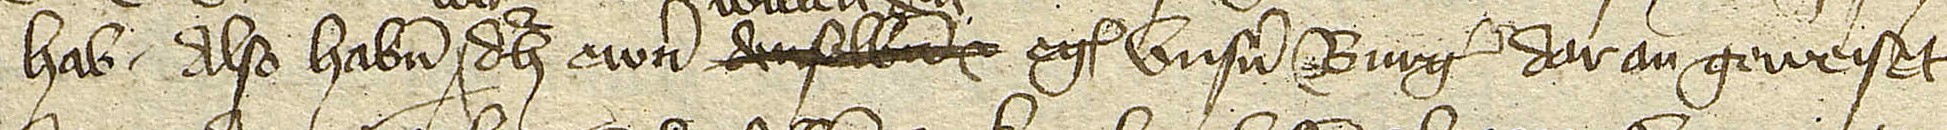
hab / Alſo habn* d*h ewn* denſelbn* v eg* vnſn* Burg* daran geweiſet
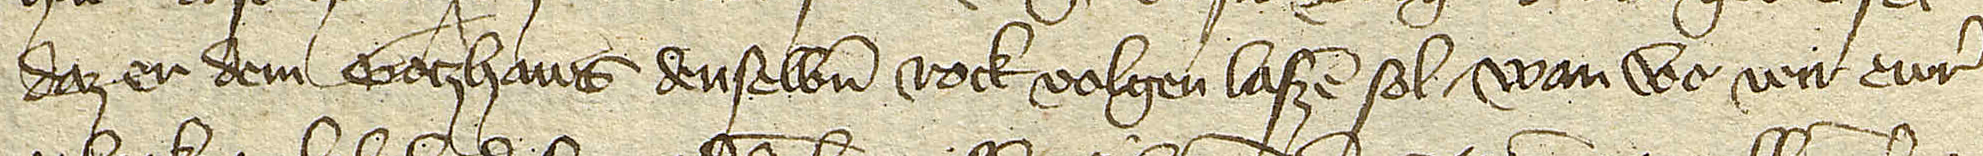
daʒ er dem Gocʒhaws denſelbn* rock volgen laſʒe* ſol / wan wo wir ewr*
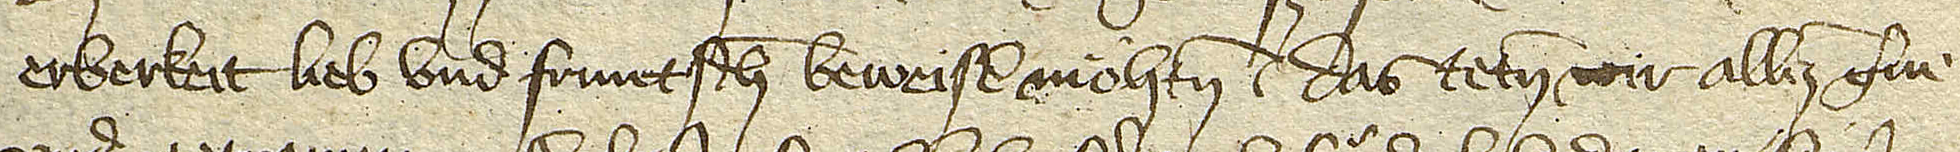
erberkeit lieb vnd fruntſch* beweiſe* möhtn* / das tetn* wir allcʒ* g*ne
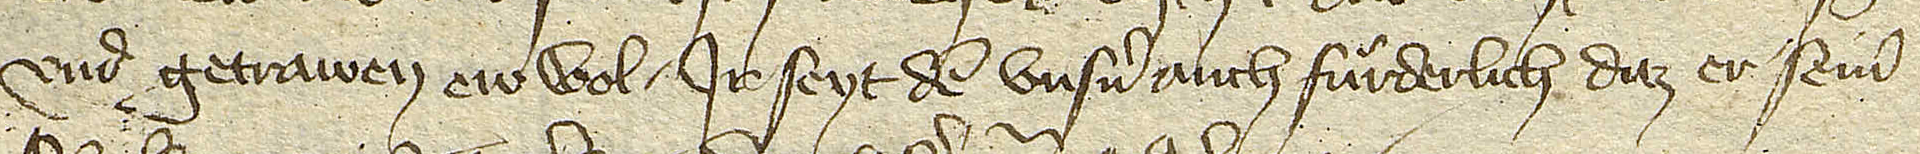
vnd getrawen ew wol / Ir ſeyt d* vnſn* auch fürderlich daʒ er ſein*
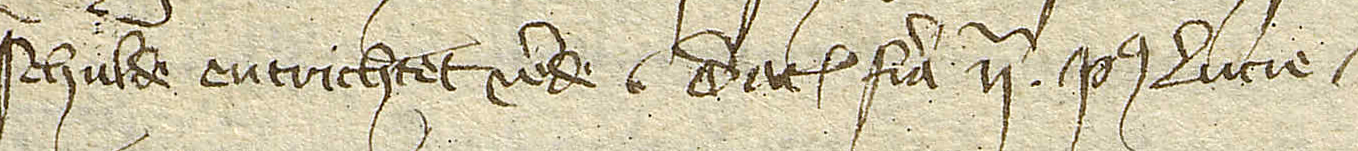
ſchulde entrichtet w*d / Dat* fia* ii* . p* Lucie /
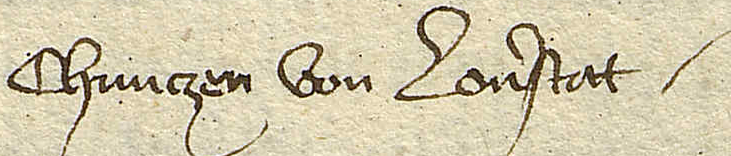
Chuncʒen von Lon*ſtat /
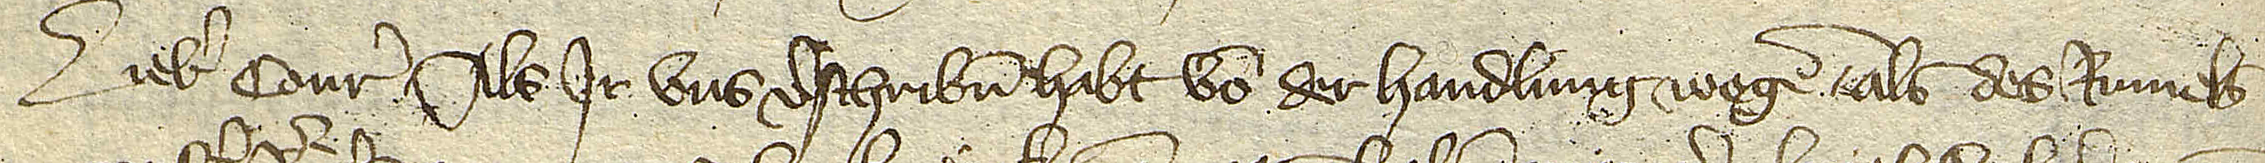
Lieb* Conr* / Als ir vns v*ſchribn* habt vo* der handlung weg* / als des Rumels
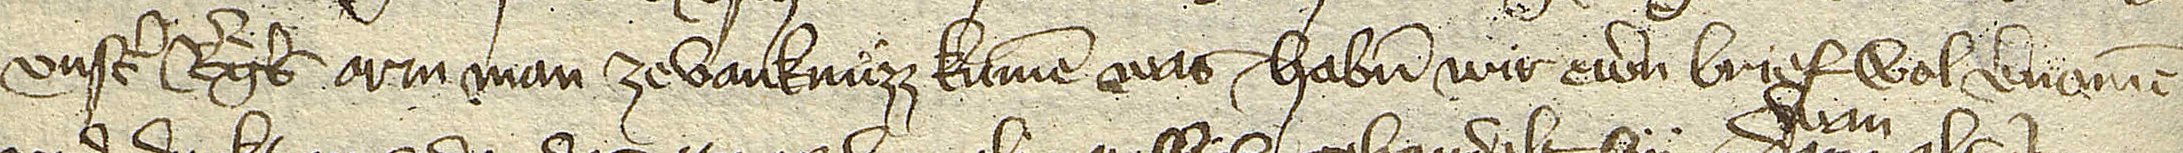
vnſ*s B*g*s armman cʒevanknüʒʒ kume* was / habn* wir ew*n brief wol v*nome*
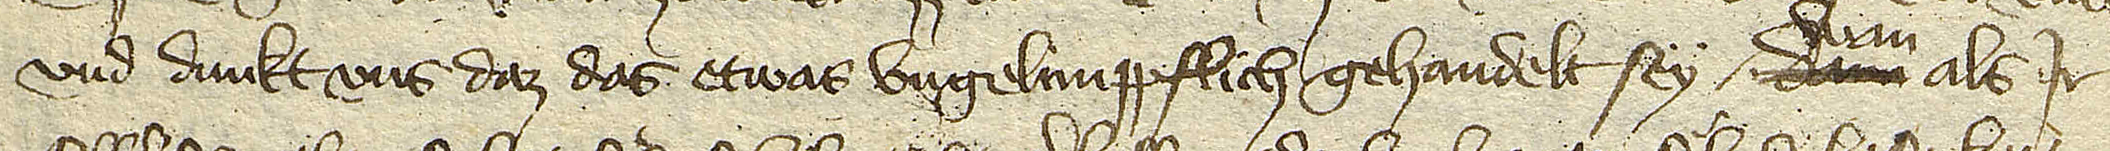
vnd dunkt vns daʒ das etwas vngelimppflich gehalndelt ſey /. dann als Ir
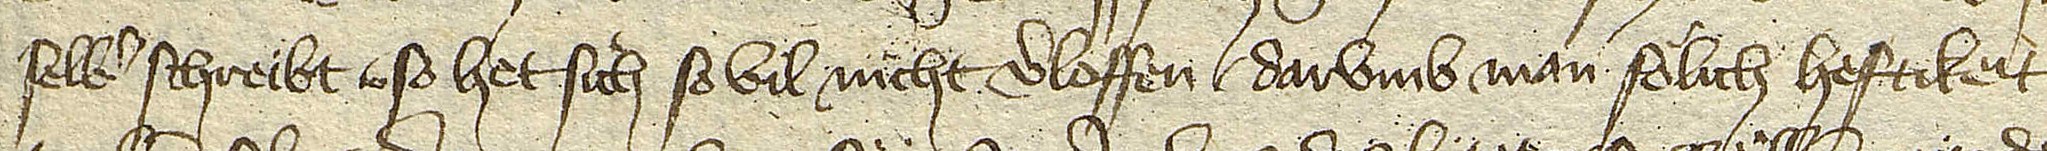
ſelb* ſchreibt / ſo het ſich ſo vil nicht v*loffen / darvmb man ſölich heftikeit
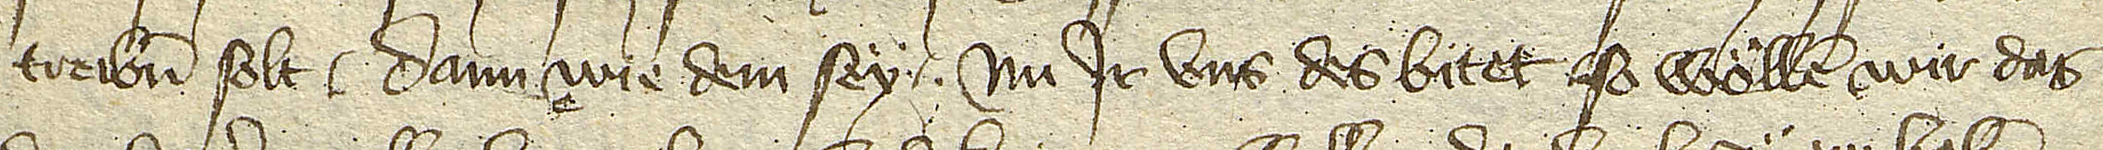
treibn* ſolt / Dann wie dem ſey /. Nu Ir vns des bitet / ſo wölle* wir das
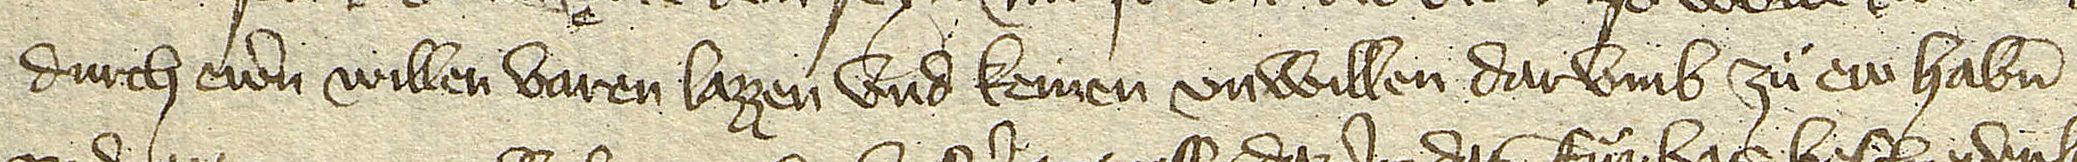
durch ew*n willen varen laʒʒen vnd keinen vnwillen darvmb cʒü ew habn*
